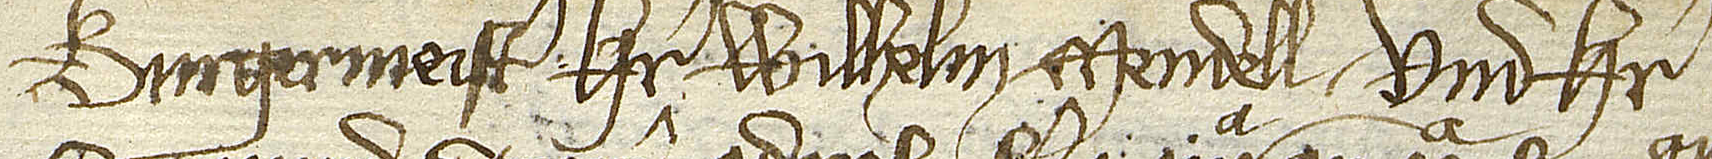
Burgermeiſt* H*r Wilhelm Mendell / Vnd H*r
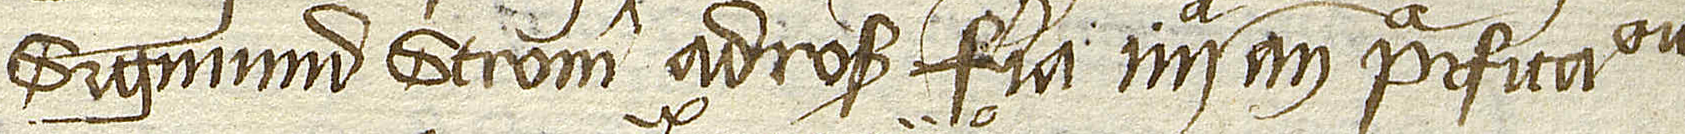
Sigmund Strom* adroſ* fia* iiii* an* p*ifica*
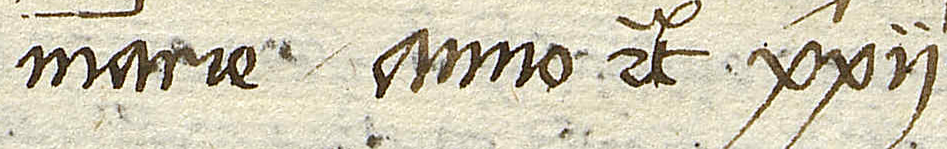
marie / anno ec* xxii*
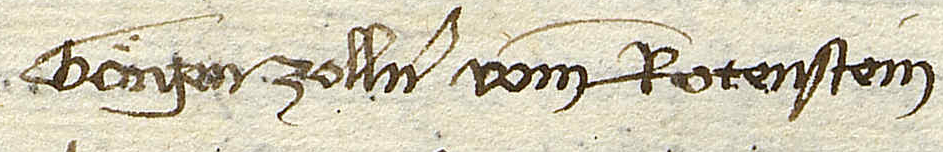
Görgen ʒolln* vom* Rotenſtein
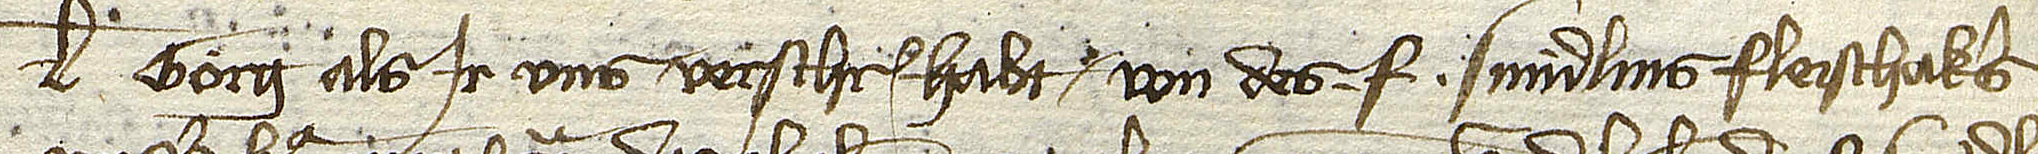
L* Görg als Ir vns verſchr* habt / von des . f. ſmidlins fleiſchak*s
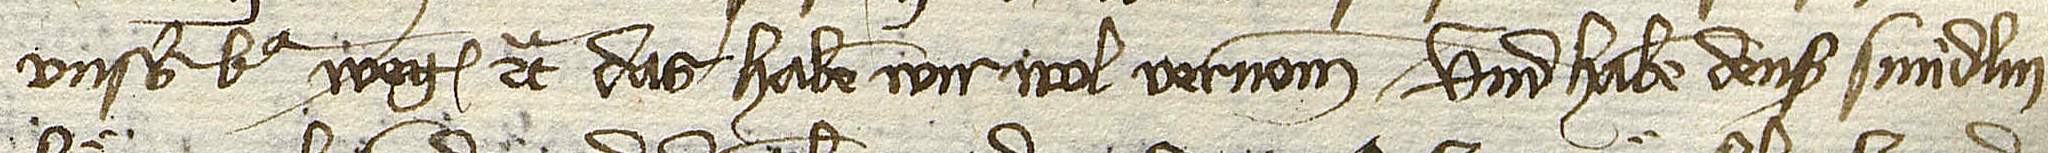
vnſ*s b* weg* ec* das habe* wir wol vernom* / Vnd habe* denſ* ſmidlin
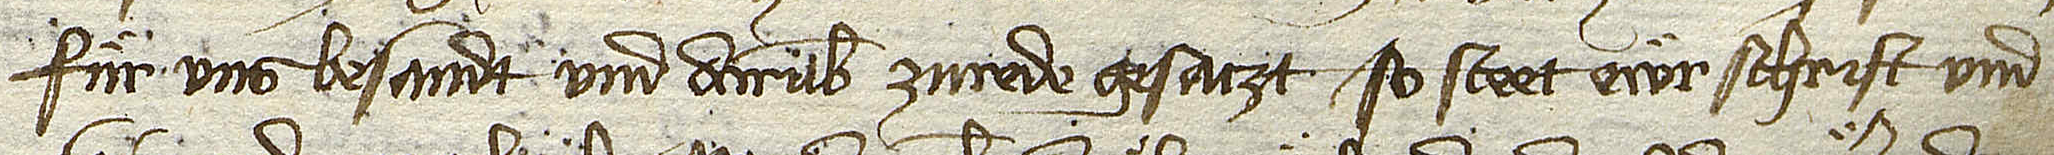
für vns beſandt vnd darub* ʒurede geſacʒt . / ſo ſteet ewr ſchrift vnd
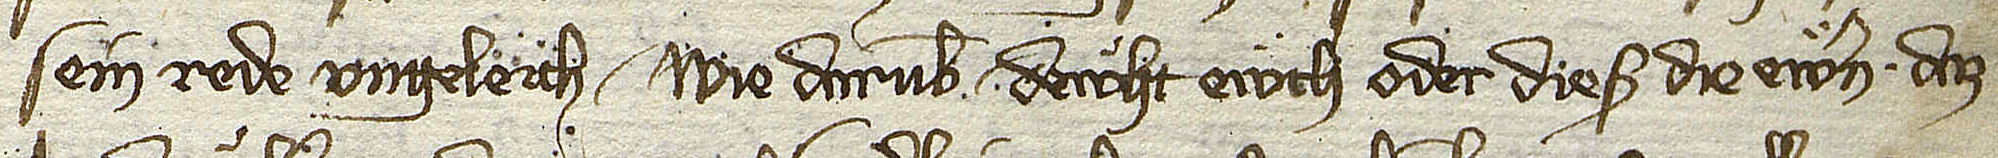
ſein rede vngeleich / Wie darub* / dewcht ewch oder dieſ* die ew*n . daʒ
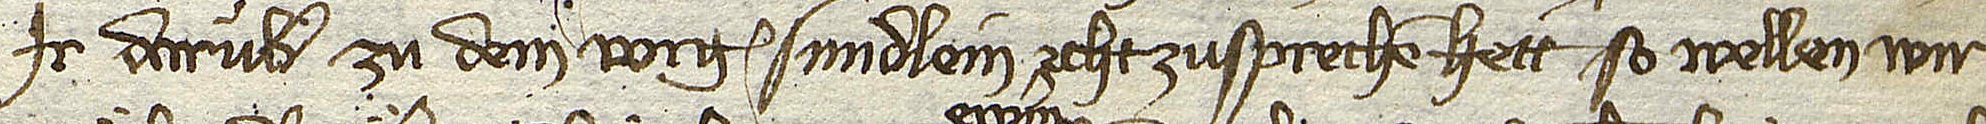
Ir darüb* ʒu dem vorg* ſmidlein icht ʒuſpreche* hett / ſo wellen wir
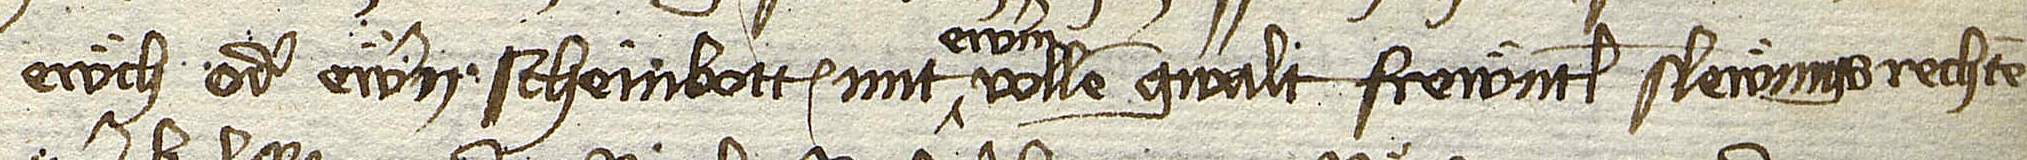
ewch od* ew*n ſcheinbott* mit volle* gwalt frewntl* ſlewnigs rechte*
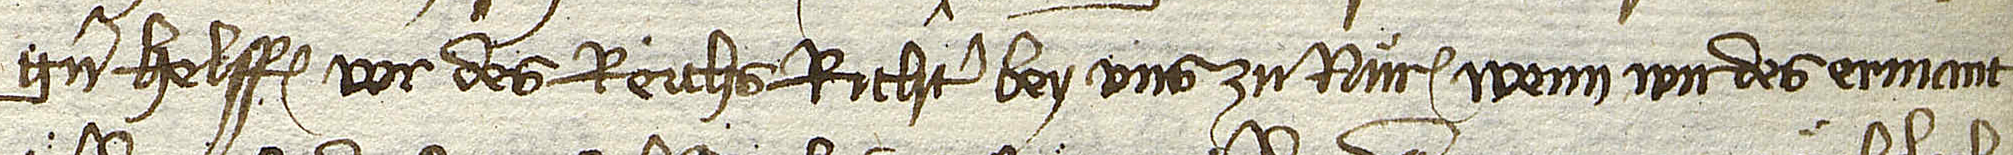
g*n helff* vor des Reichs Richt* bey vns ʒu Nür* wenn wir des ermant
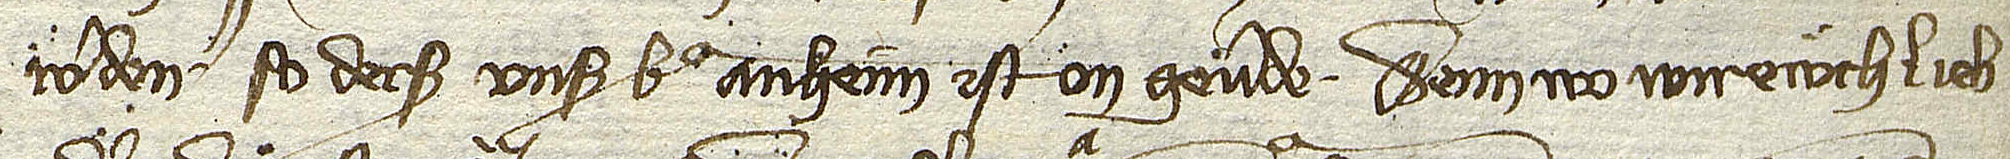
w*den . ſo derſ* vnſ* b* anheim iſt on geu*de . Denn wo wir ewch lieb
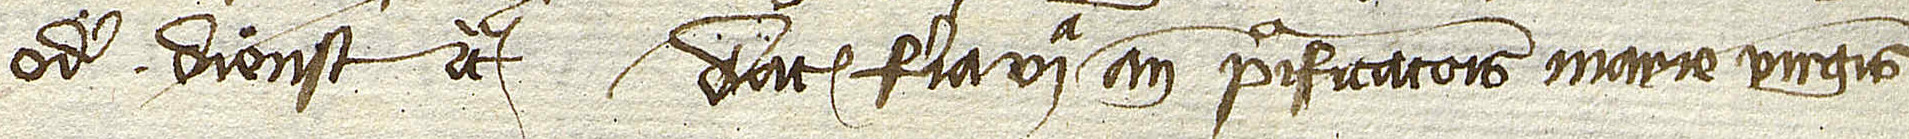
od* dienſt ec* / Dat* fia* vi* an* p*ificacois* marie virg*is
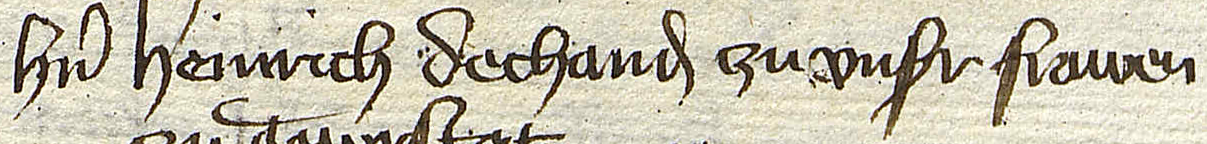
H*n Heinrich Dechand* cʒu vnſ*r frawen
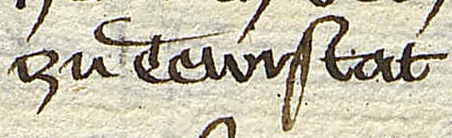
cʒu Tewrſtat
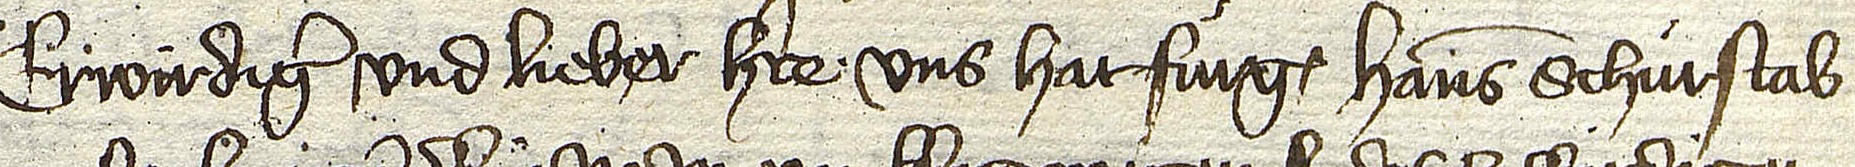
Erwirdig* vnd lieber h*re . vns hat fürg* han*s Schürſtab
